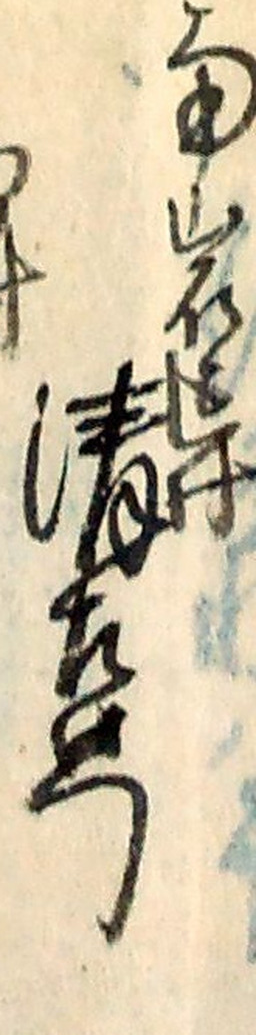庄左衛門
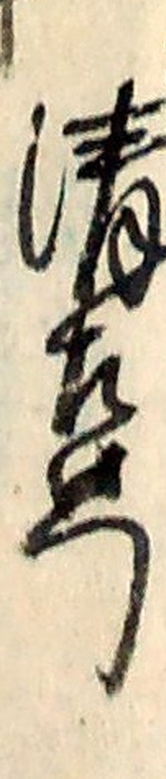庄左衛門
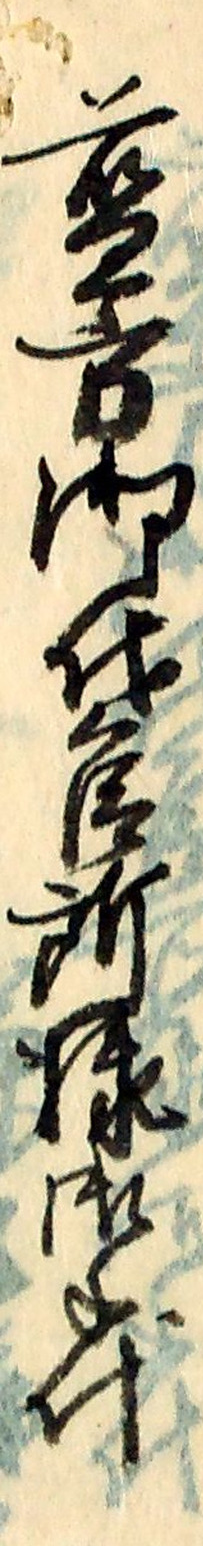藍方御代官所様御手代
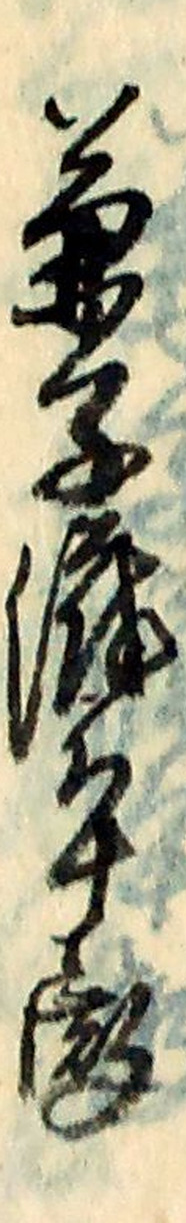兼子儀平殿
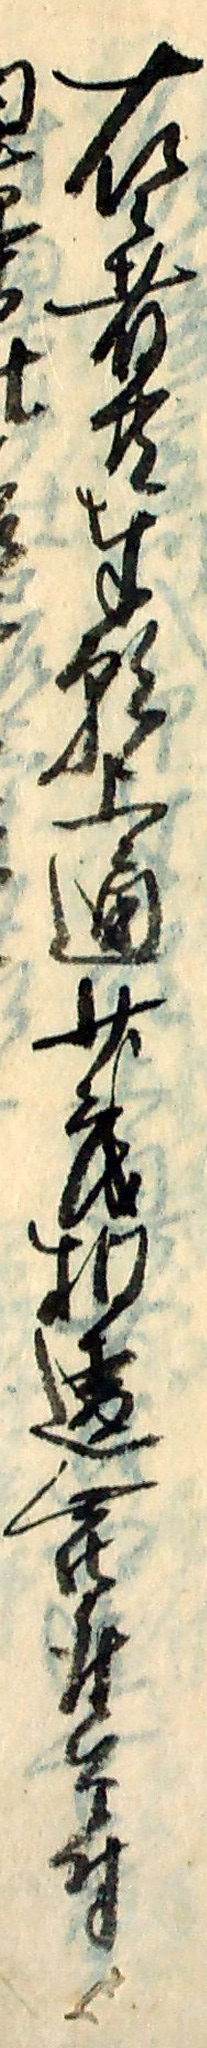右之者共奉願上通少も相違無御座候に付
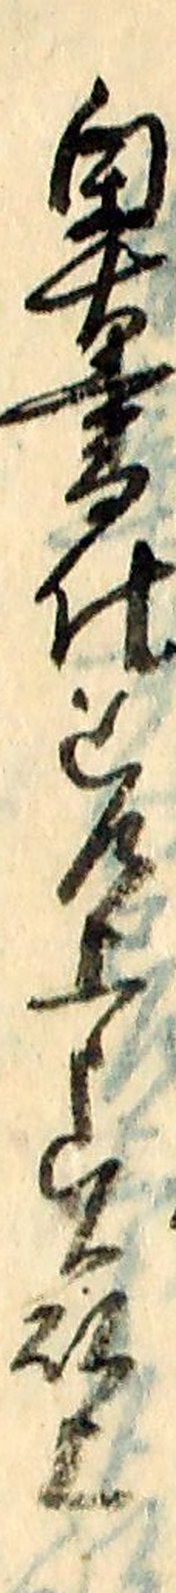奥書仕差上申上候以上
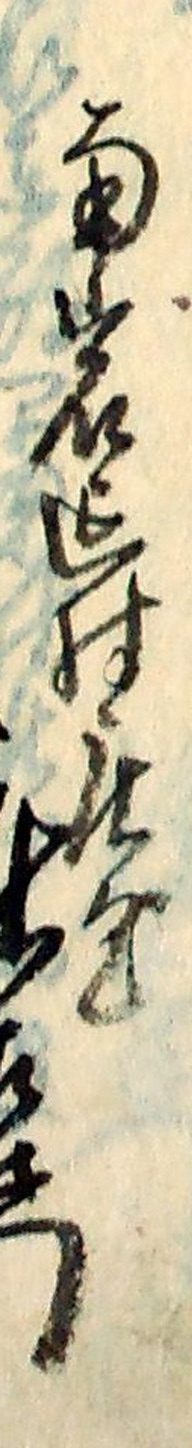南岩延村庄屋
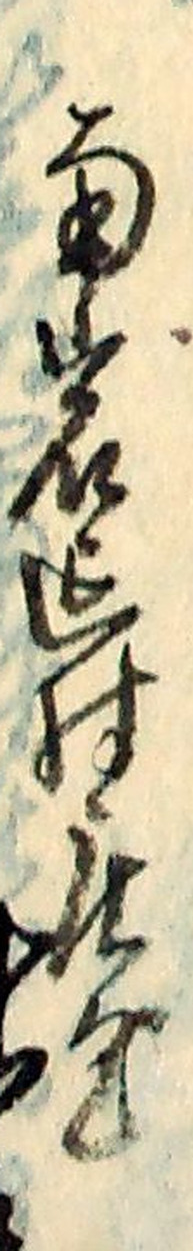南岩延村庄屋
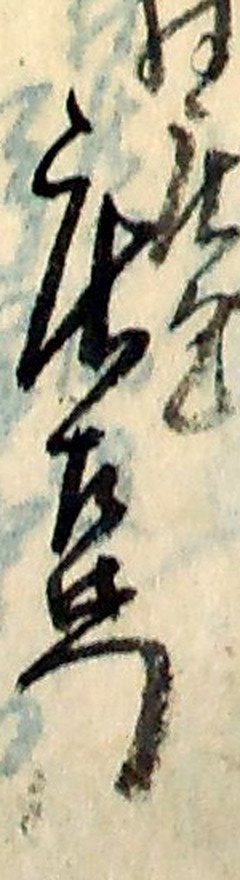庄左衛門
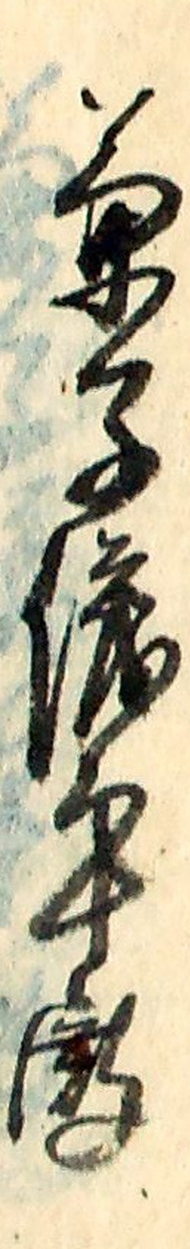兼子儀平殿

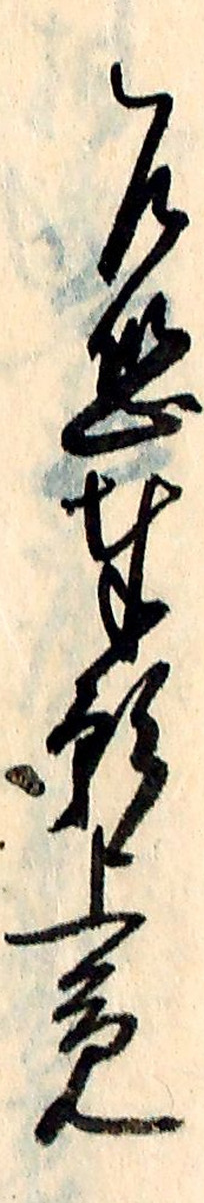乍恐奉願上覚
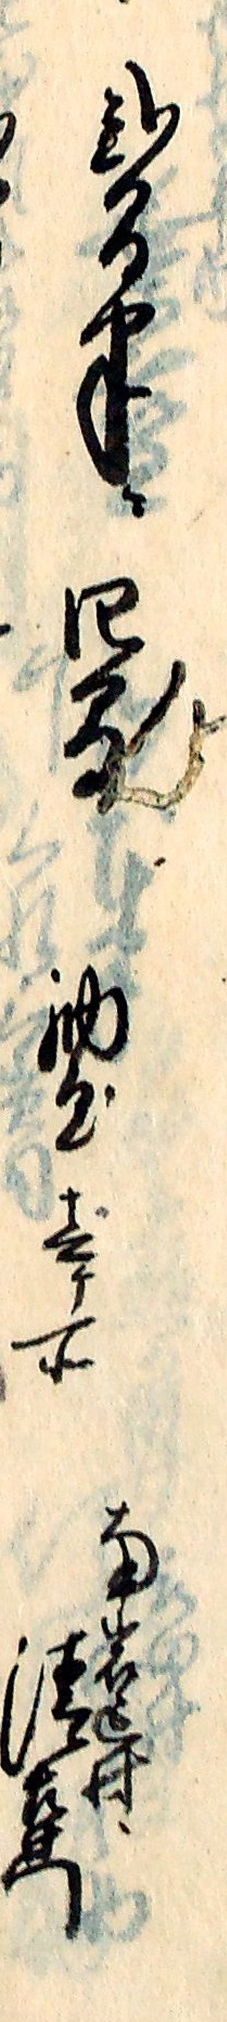一弐間半に四間納屋壱ヶ所清左衛門
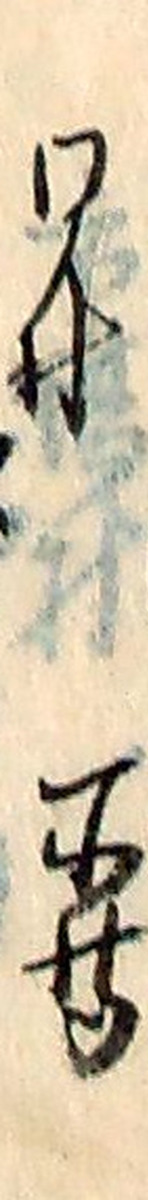同村所持
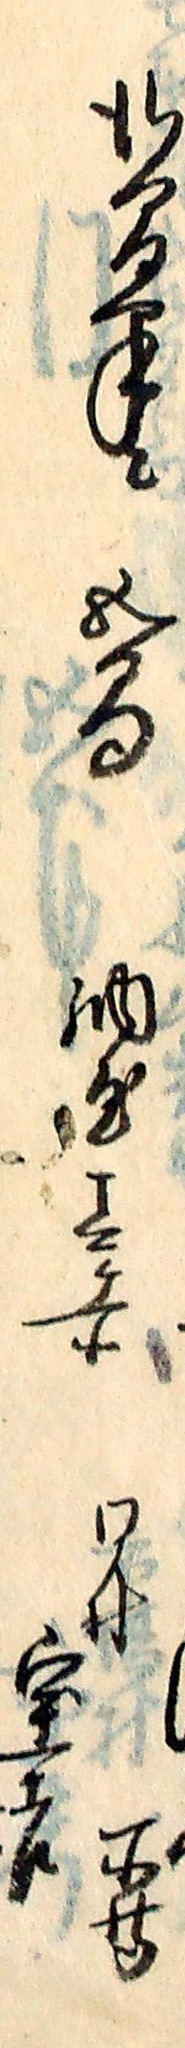一弐間半に五間納屋壱ヶ所宝吉
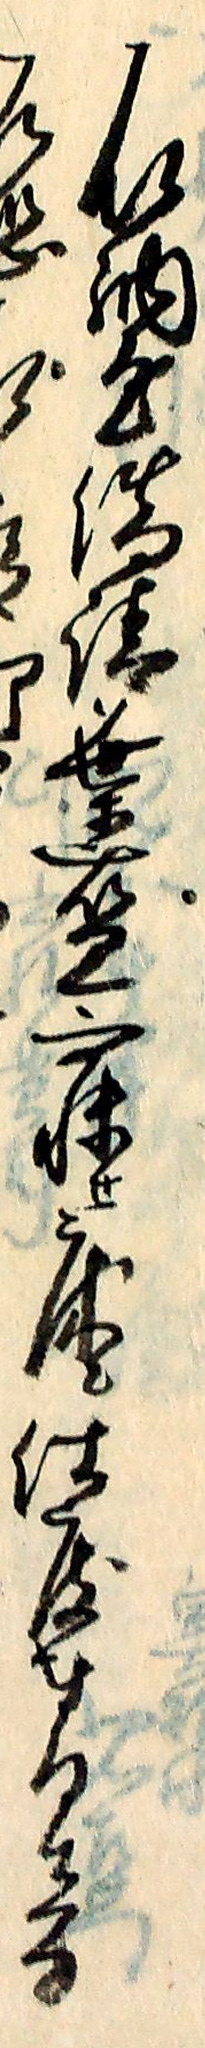右納屋借請葉藍寐せ床に仕度奉存候間
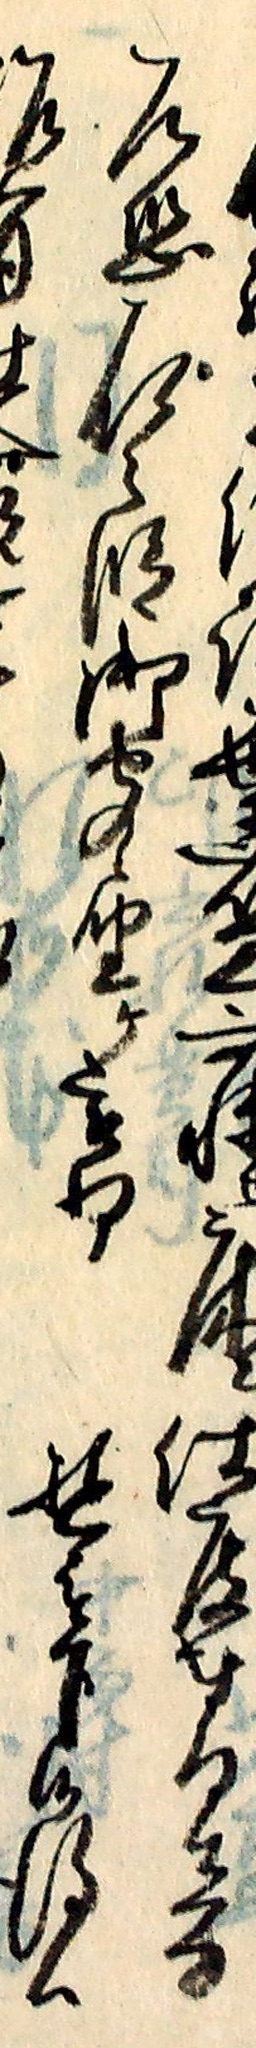乍恐右之段御聞届け被為遊被下候得は
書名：諸御願書控(後藤氏壱番）
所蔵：鳴門教育大学 Naruto University of Education
